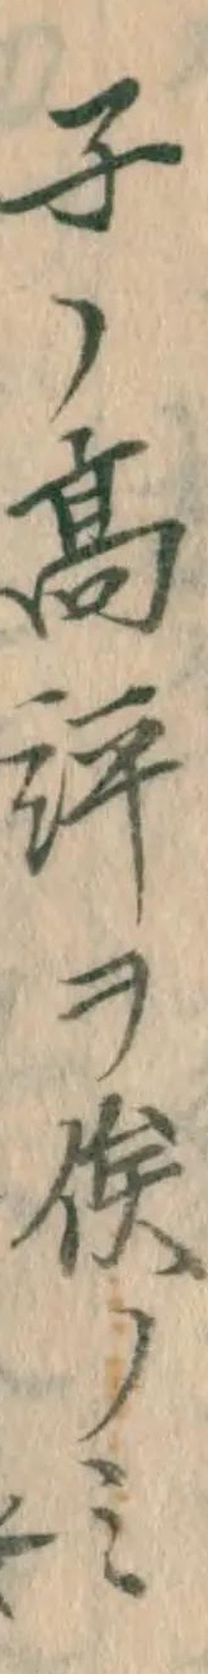子ノ高評ヲ俟ノミ
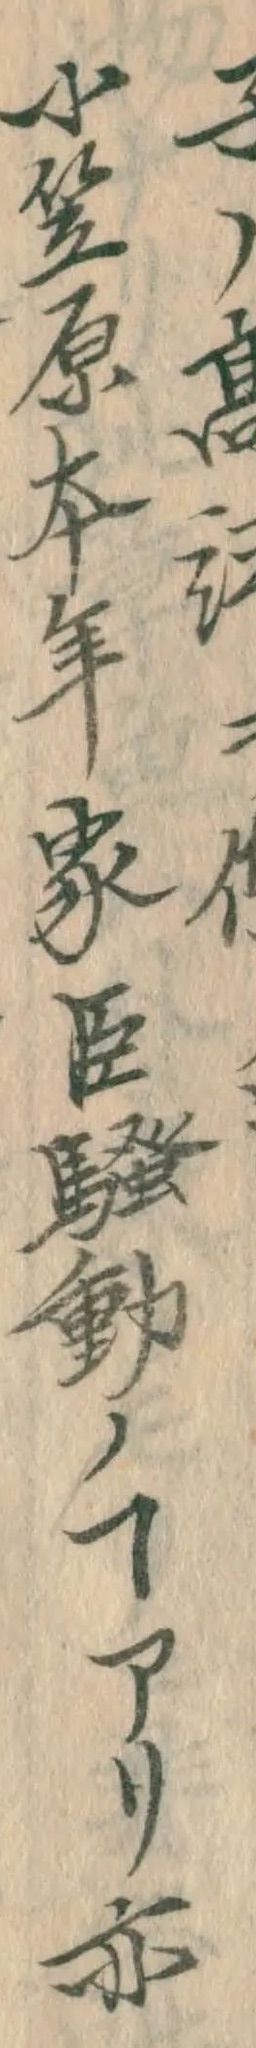小笠原本年家臣騒動ノコトアリ亦
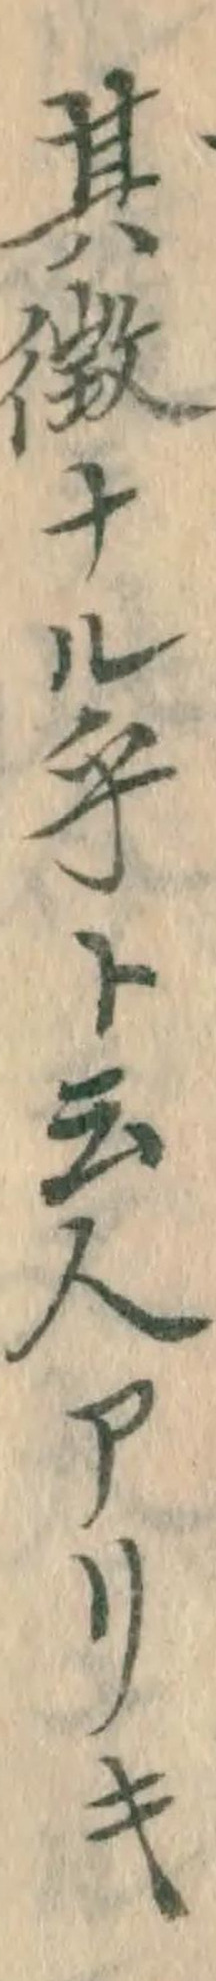其徴ナル乎ト云人アリキ

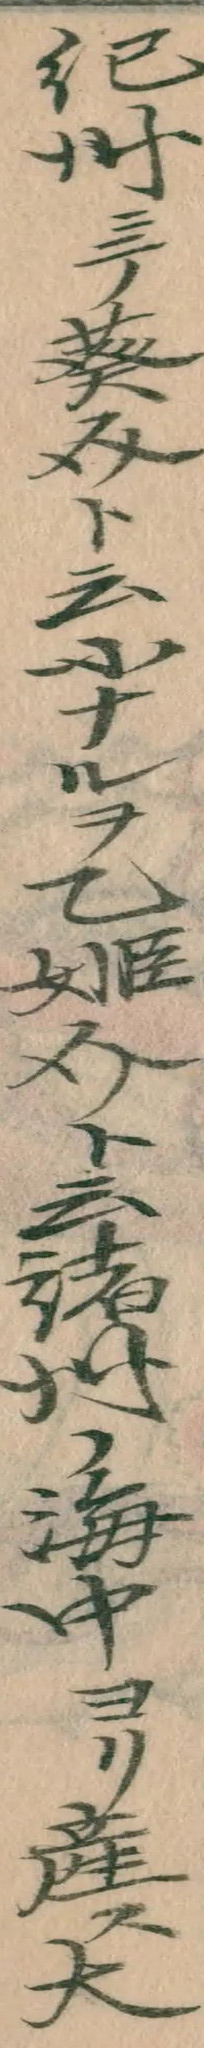紀州ニテ葵介ト云小ナルヲ乙姫介ト云諸州ノ海中ヨリ産ス大
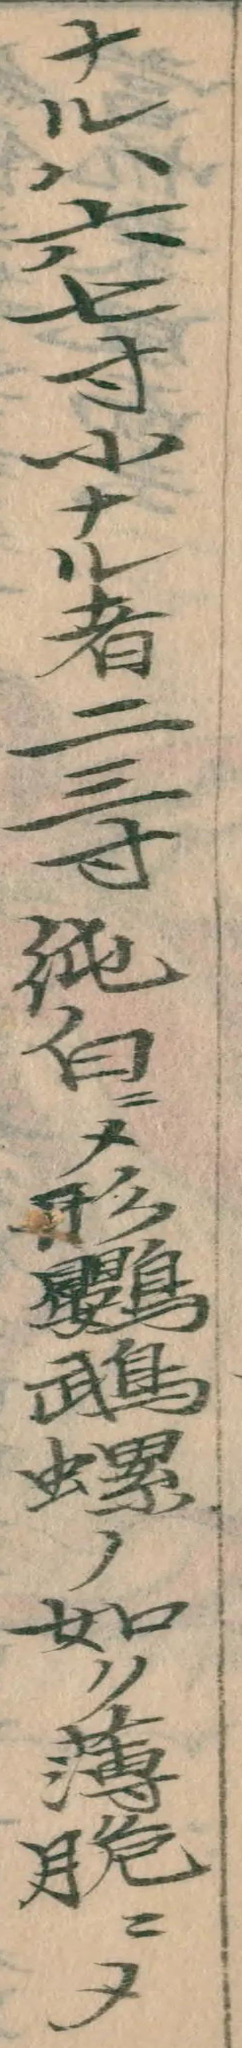ナルハ六七寸小ナル者二三寸純白ニシテ形鸚鵡螺ノ如ク薄脆シテ
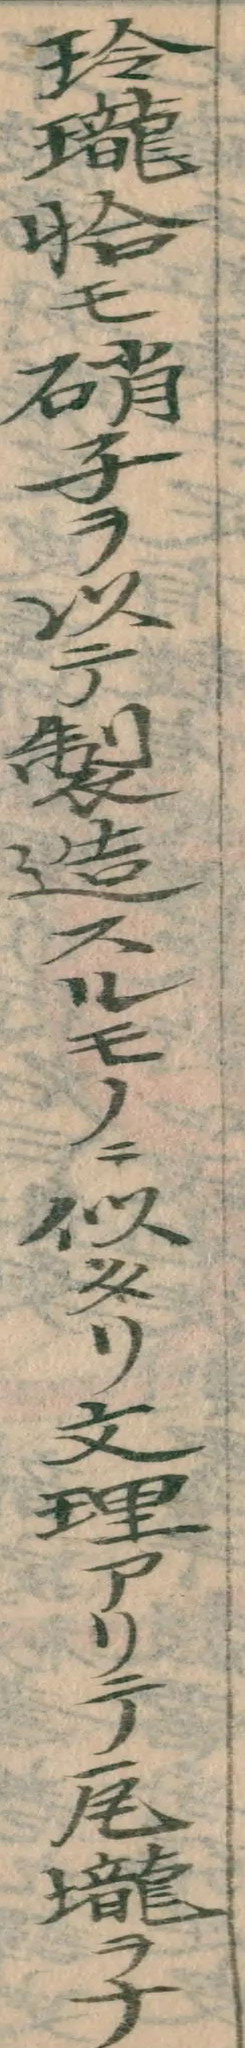玲瓏恰モ硝子ヲ以テ製造スルモノニ似タリ文理アリテ瓦壠ヲナ
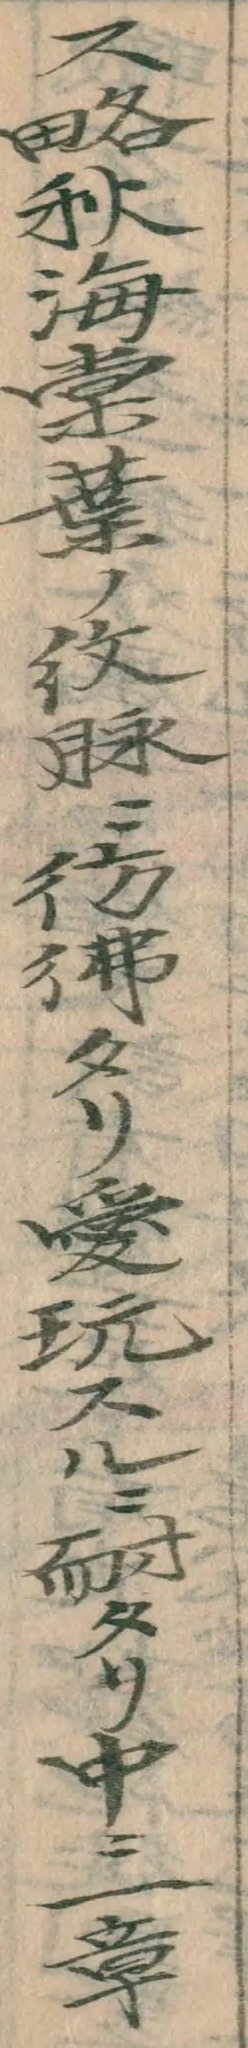ス略秋海棠葉ノ紋脉ニ彷彿タリ愛玩スルニ耐タリ中ニ一章
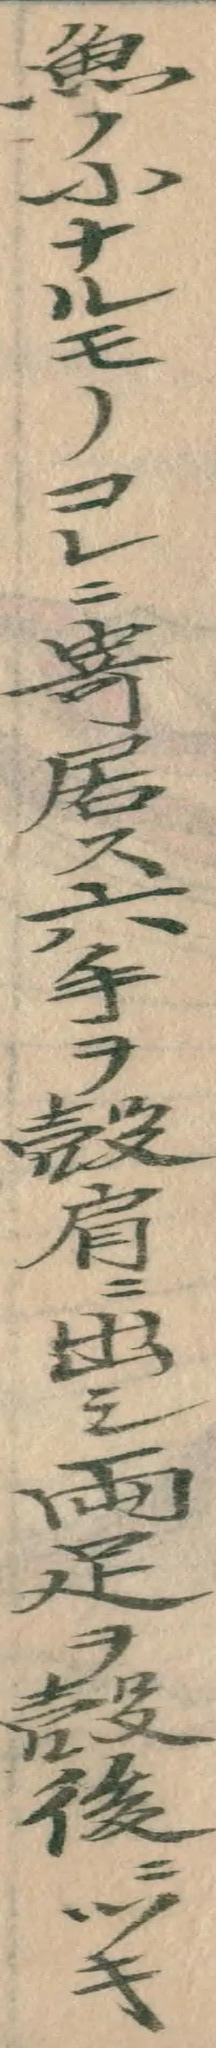魚ノ小ナルモノコレニ寄居ス六手ヲ殻肩ニ出シ両足ヲ殻後ニツキ
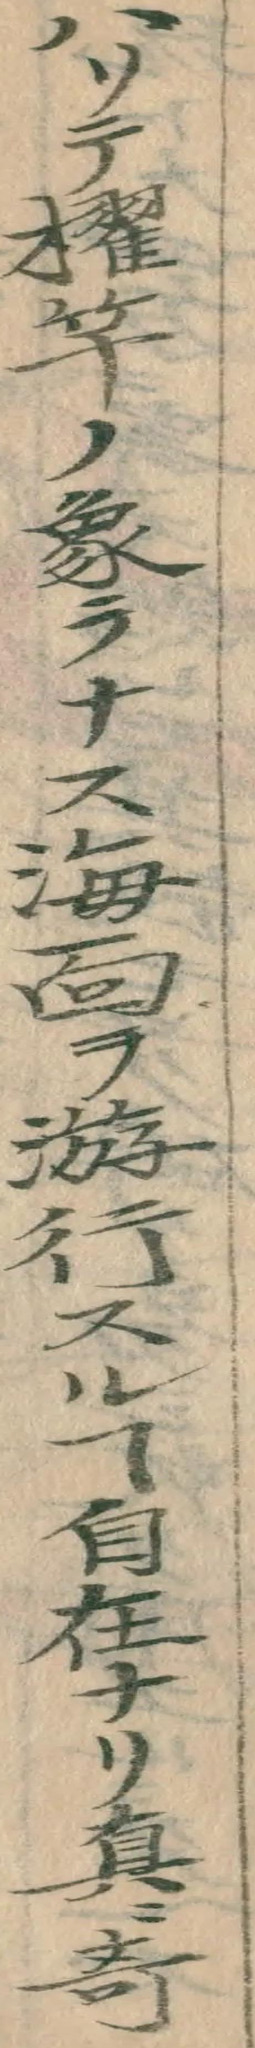ハリテ櫂竿ノ象ヲナス海面ヲ游行スルコト自在ナリ真ニ奇
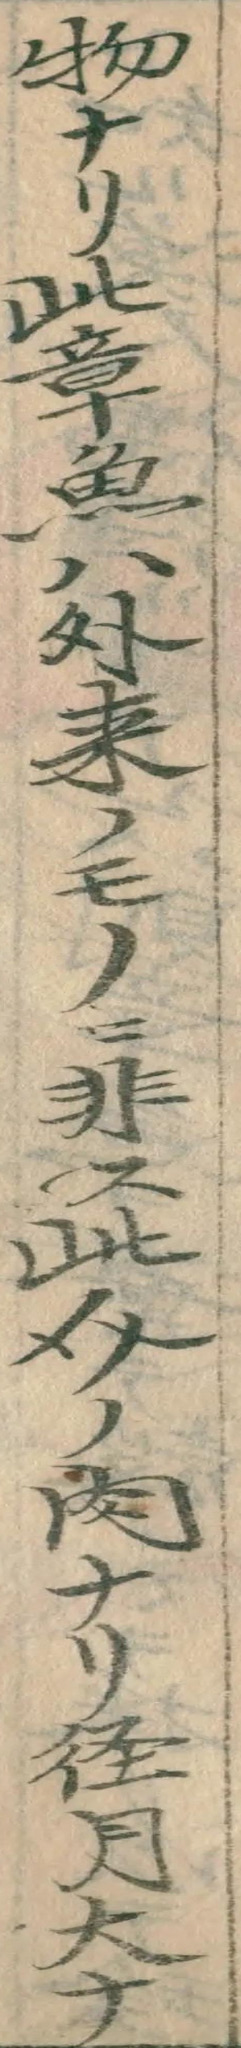物ナリ此章魚ハ外来ノモノニ非ス此介ノ肉ナリ径月大ナ
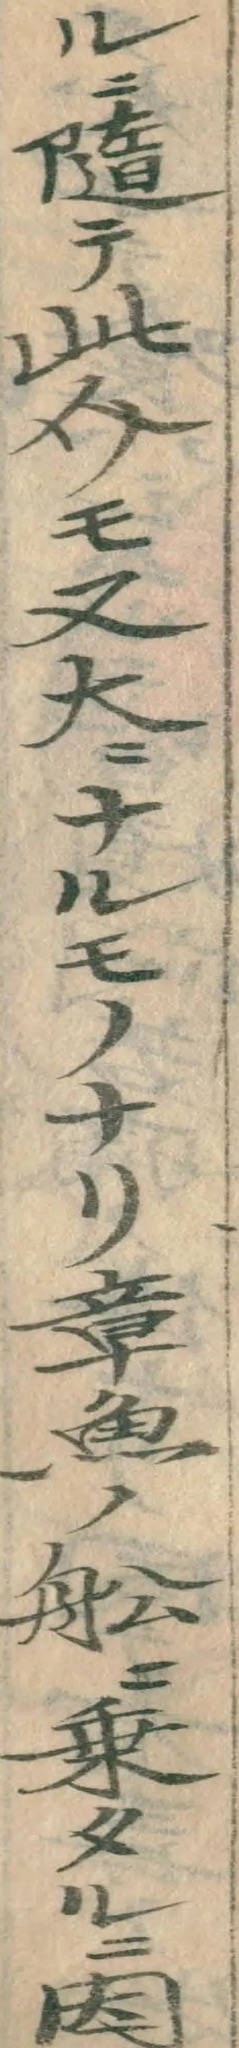ルニ隨テ此介モ又大ニナルモノナリ章魚ノ舩ニ乗タルニ因
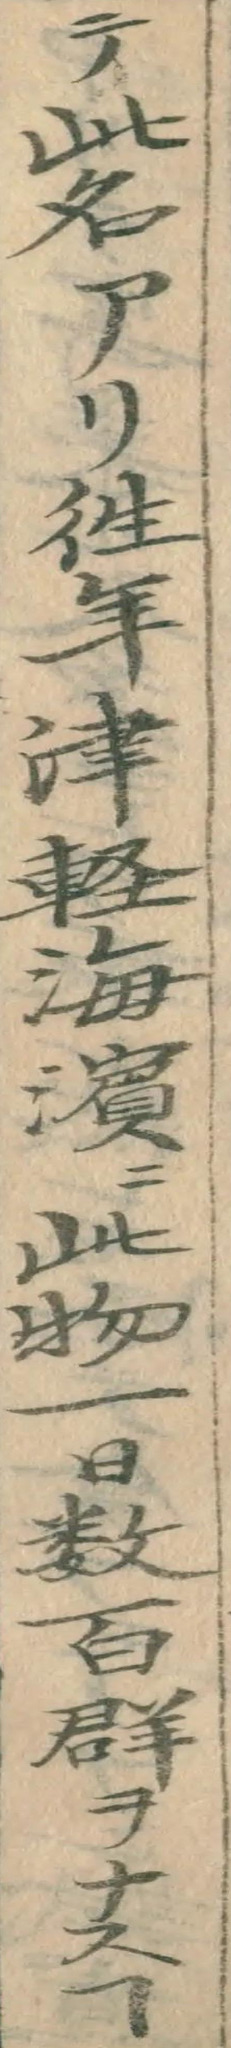テ此名アリ往年津軽海濱ニ此物一日数百群ヲナスコト

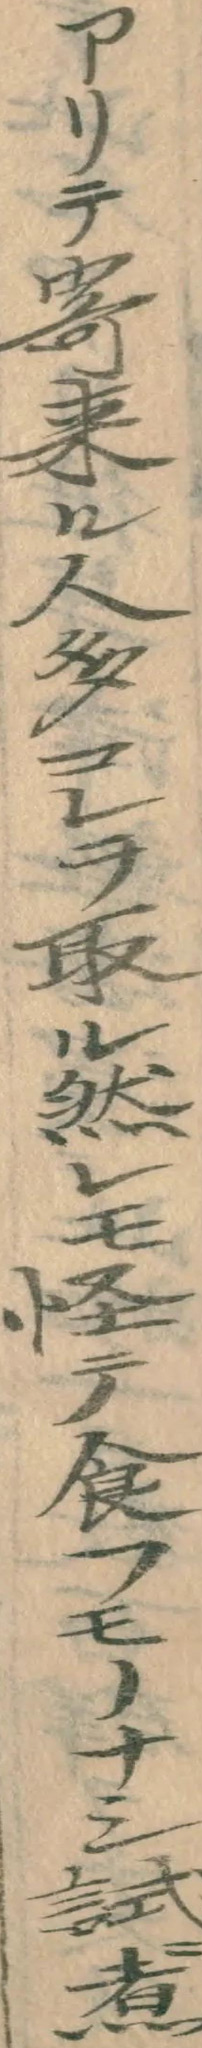アリテ寄来ル人多コレヲ取ル然レモ怪テ食フモノナシ試ニ煮
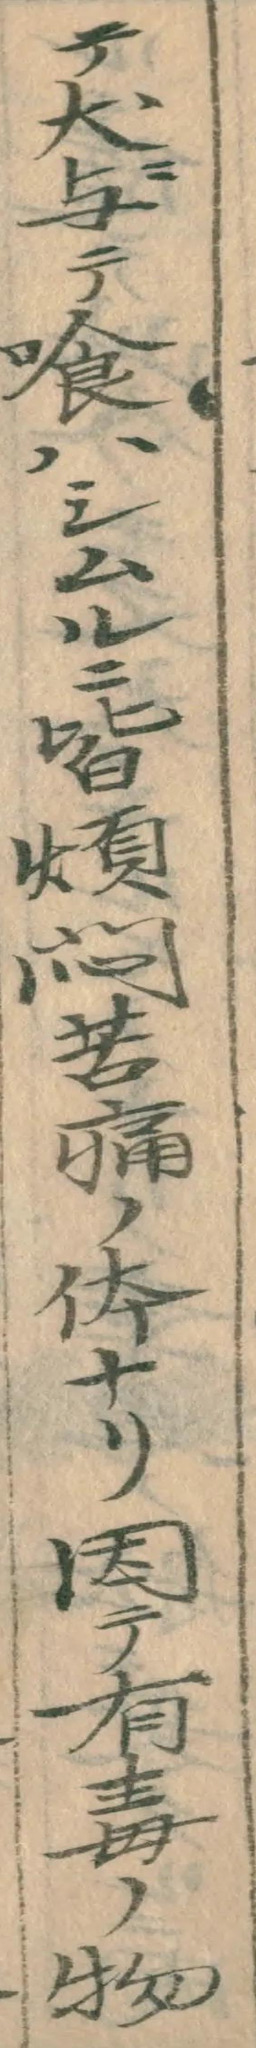テ犬ニ与テ喰ハシムルニ皆煩悶苦痛ノ体ナリ因テ有毒ノ物
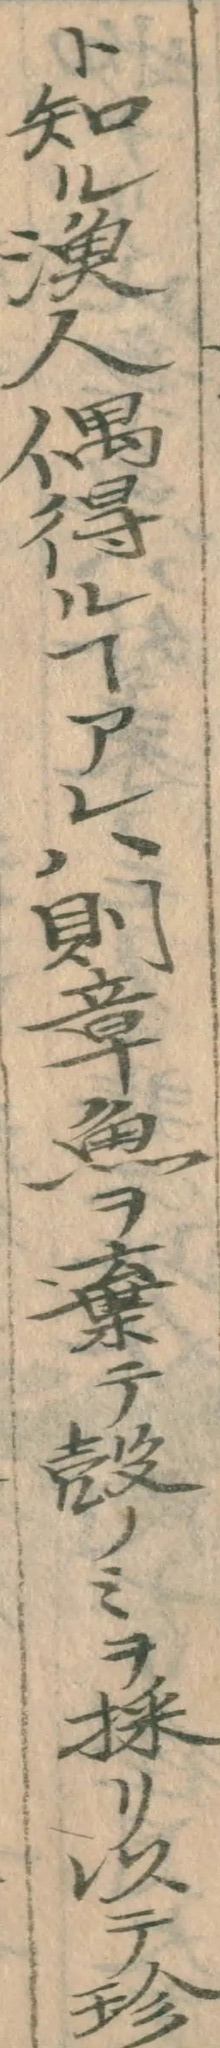ト知ル漁人偶得ルコトアレハ則章魚ヲ棄テ殻ノミヲ採リ以テ珍
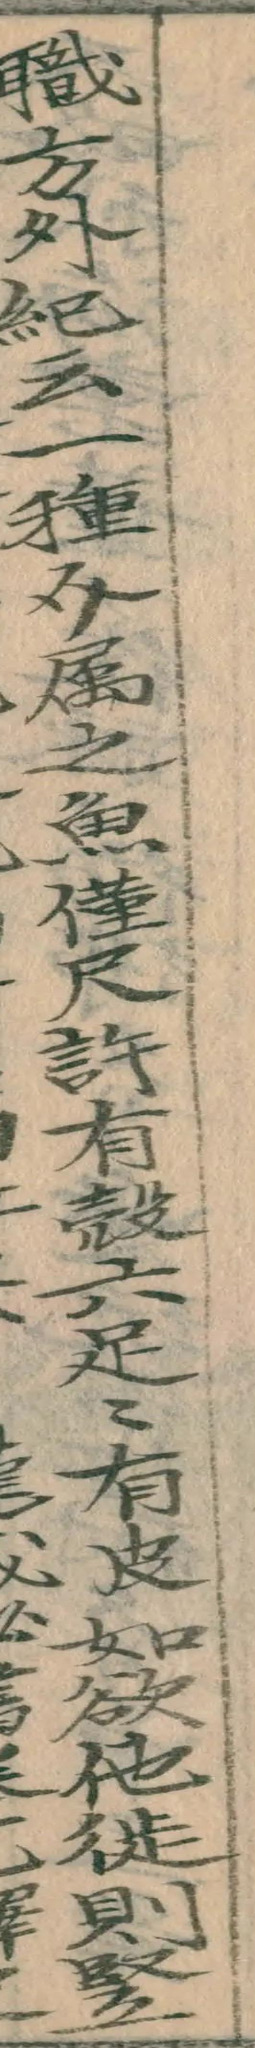職方外紀云一種介属之魚僅尺許有殻六足々有皮如欲他徙則竪
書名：千蟲譜 3巻. [2]
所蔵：国立国会図書館 National Diet Library, JAPAN
